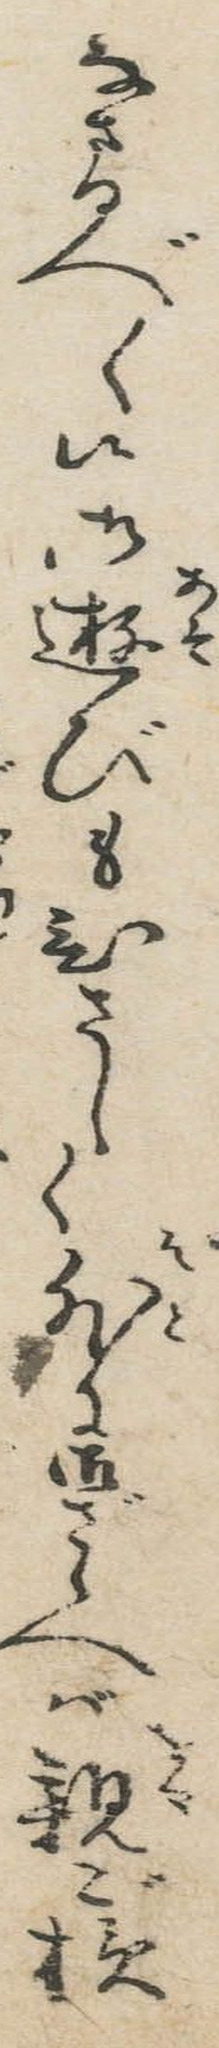なさるべく候御遊びもひさしく外に御ざらへば親ご様
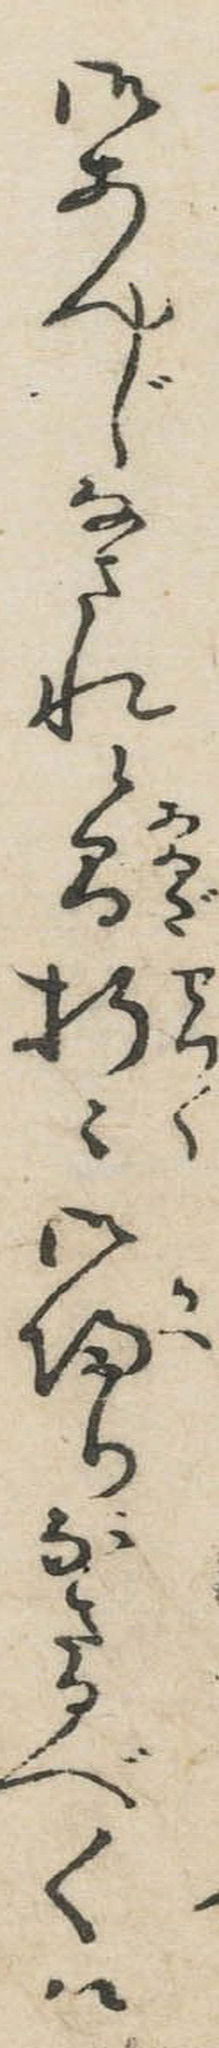御あんじなされ候間折ゝ御帰りなさるべく候
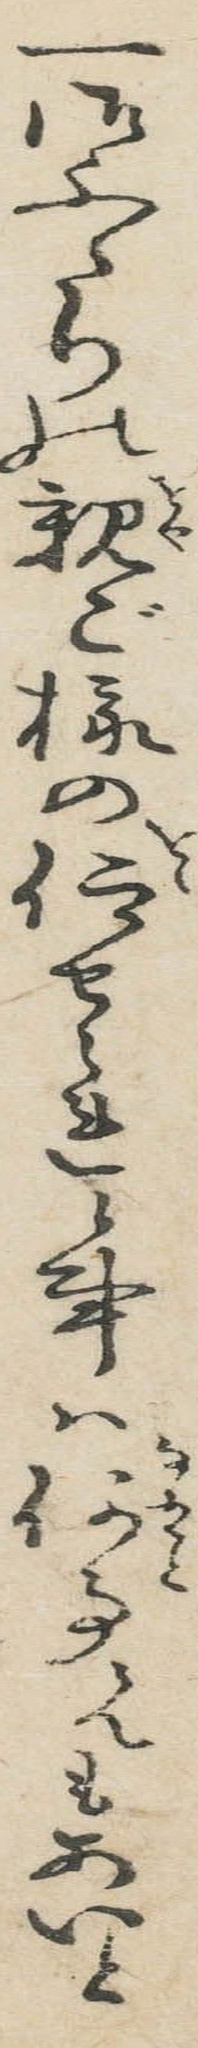一御ふたりの親ご様の仰せられ候事は何事にてもあいと
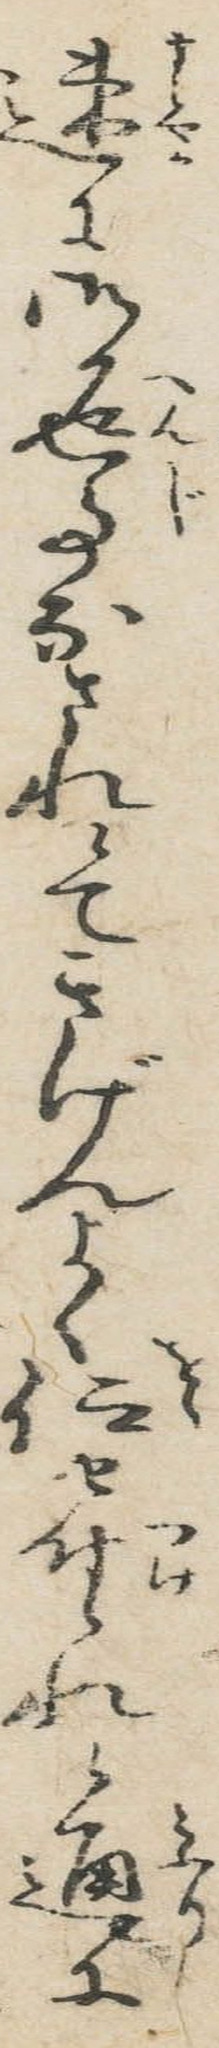速に御返事なされ候てきげんよく仰せ付られ候通に
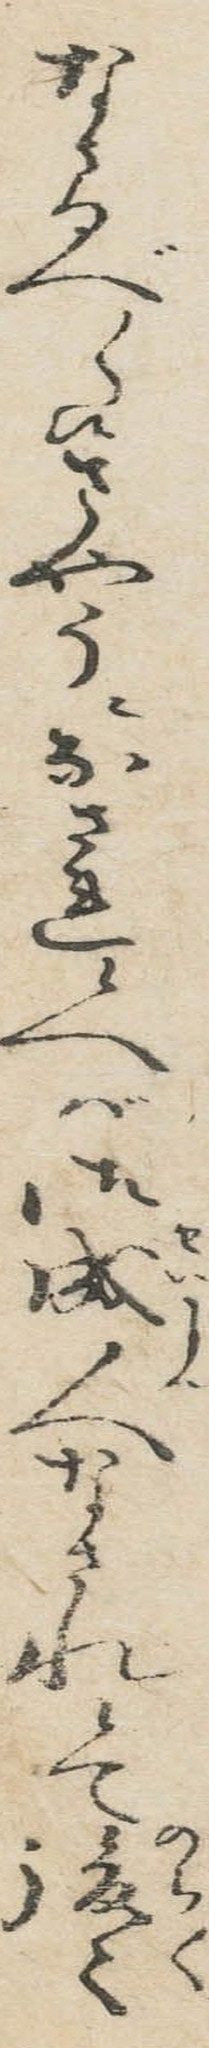なさるべく候さやうになされ候へば御成人なさなされ候て後々
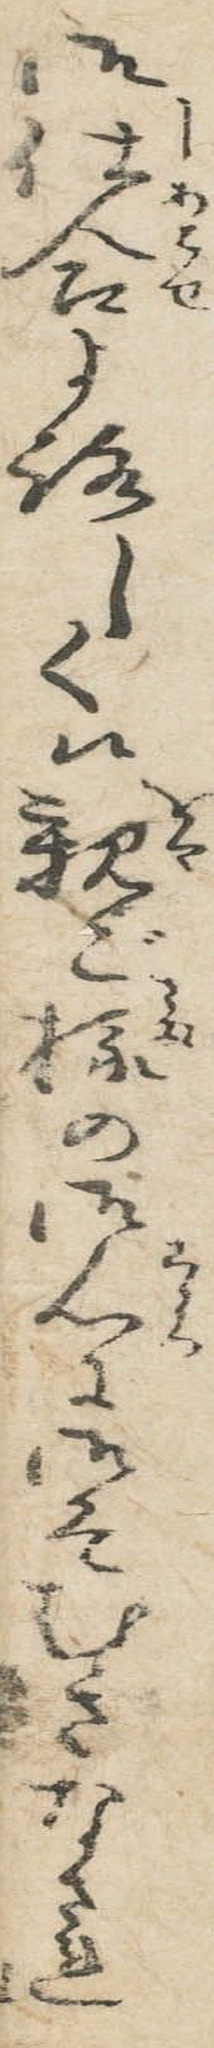御仕合よろしく候親ご様に御心御そむきなされ候
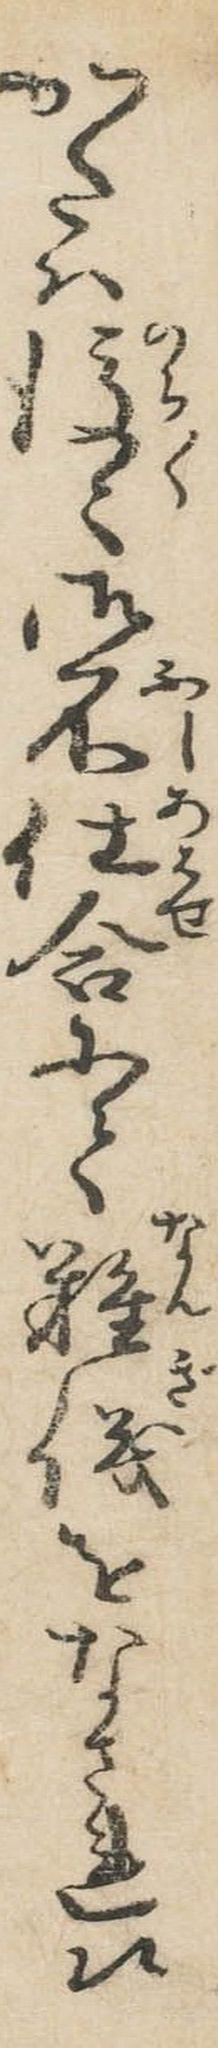かたは後々御不仕合にて難儀をなされ候
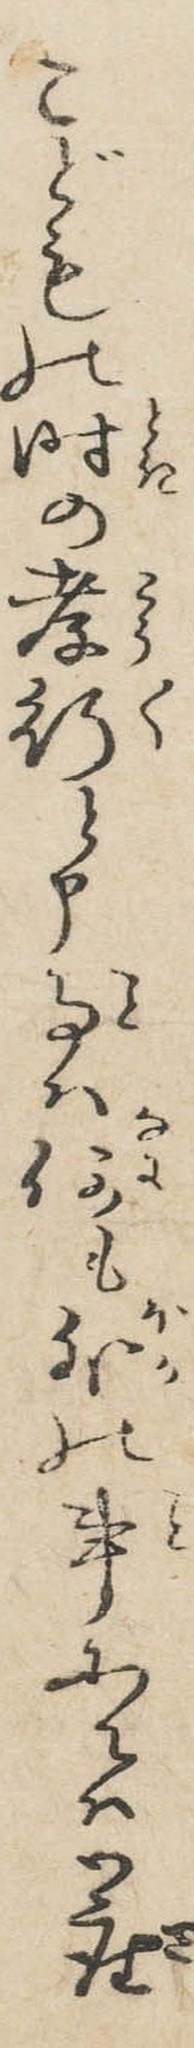こどもの時の孝行と申事は何も外の事にては御座
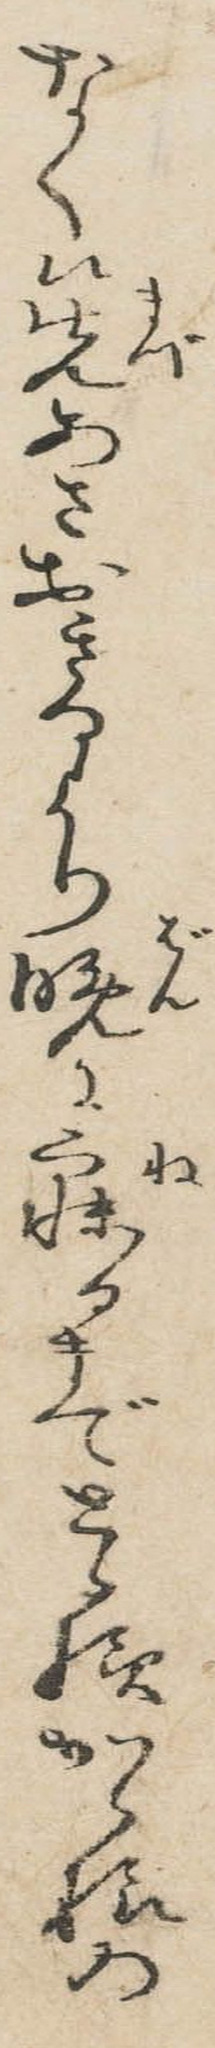なく候先あさおきるより晩に寝るまでとゝ様かゝ様の
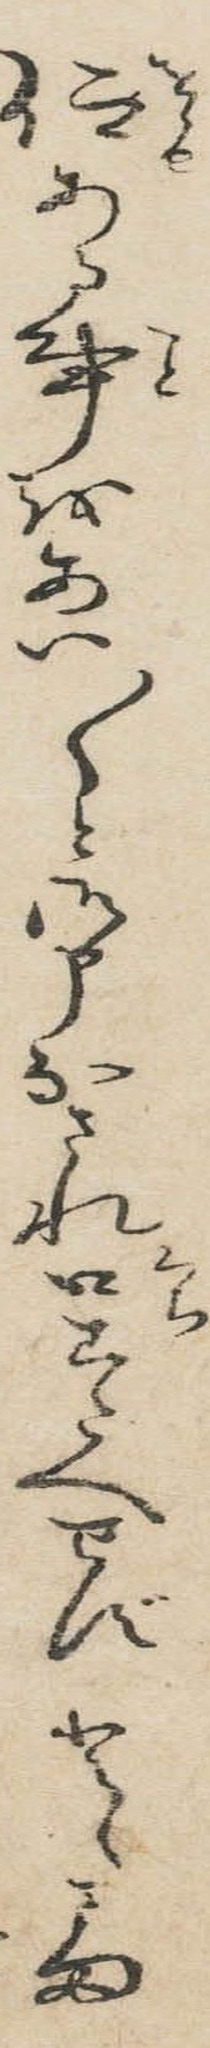仰ある事をあい〳〵と御申なされ口こたへせずとゝさま
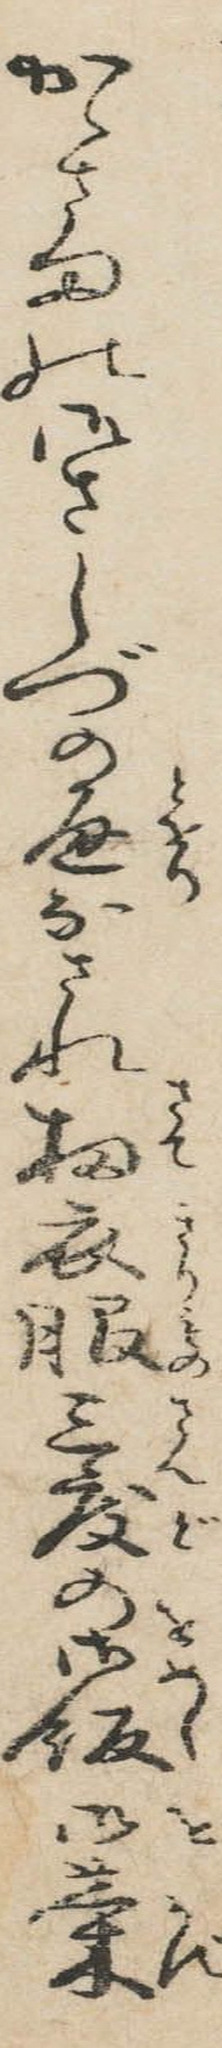かゝさまの御さしづの通なされ扨衣服三度の御飯御菜
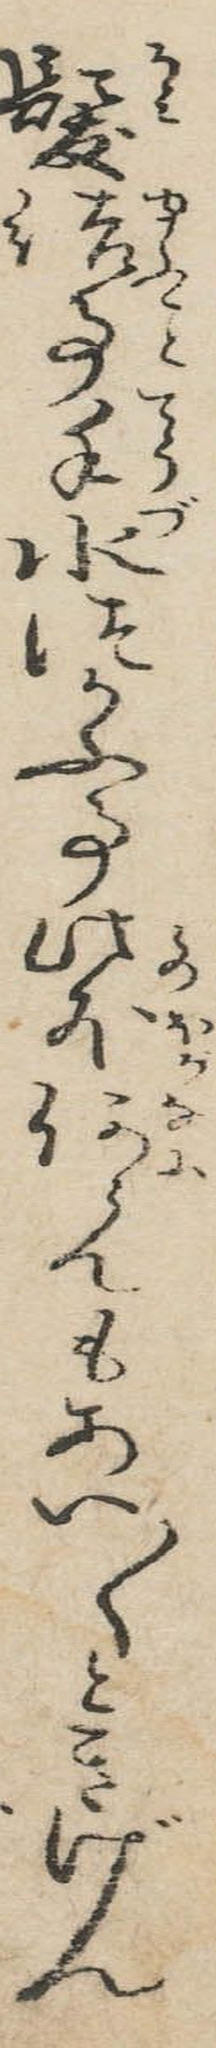髪結事手水つかふ事此外何にてもあい〳〵ときげん
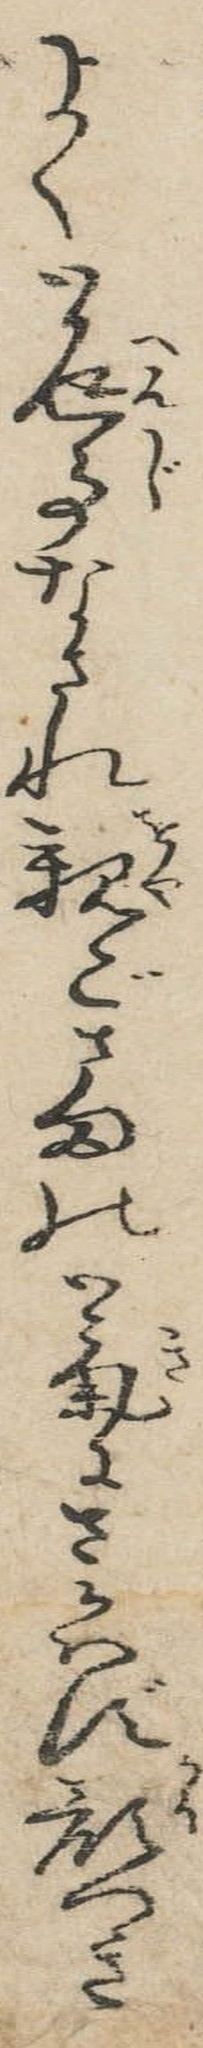よく御返事なされ親ごさまの御気にさかはず顔つき
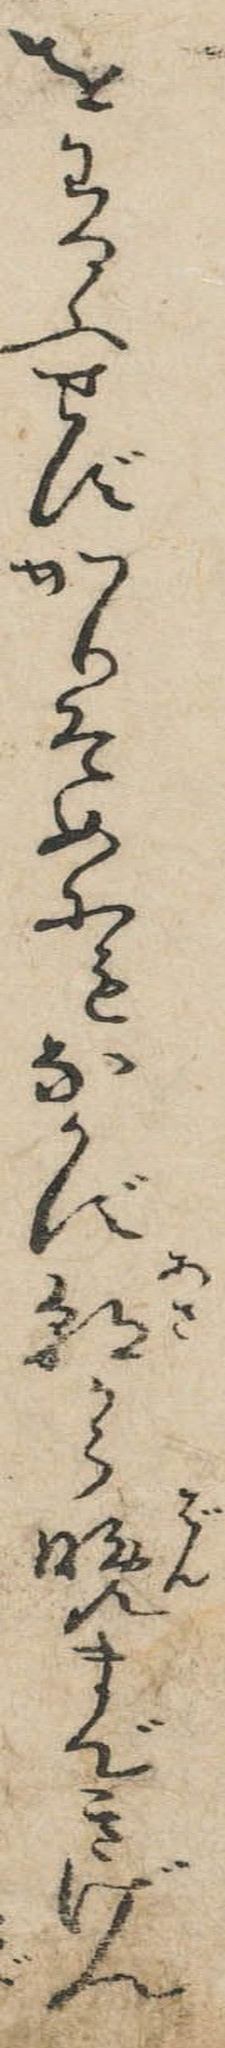をわるふせずかりそめにもなかず朝から晩まできげん
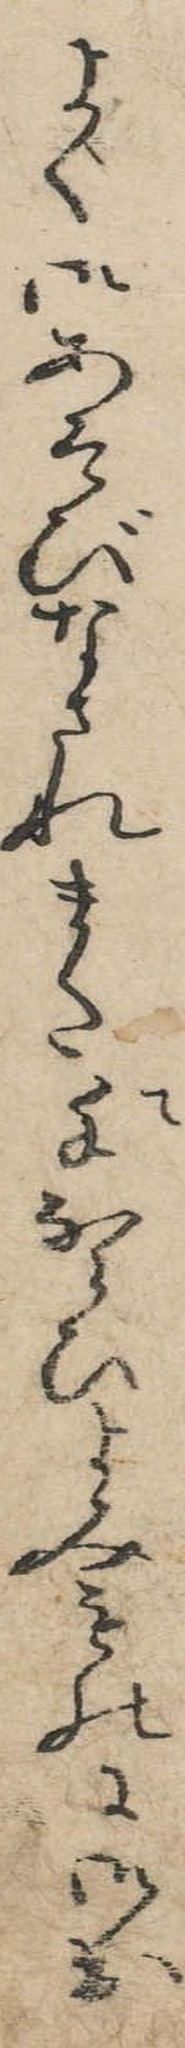よくあそびなされまた手ならひよみものに御出
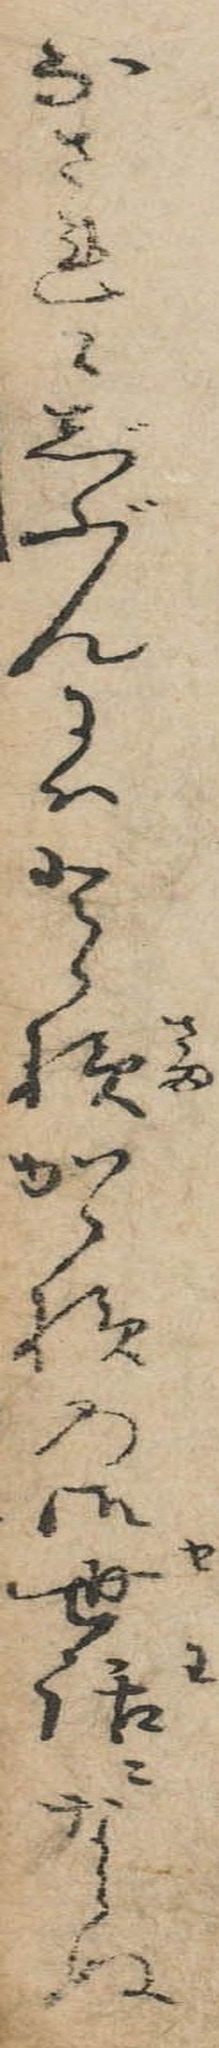なされてじぶんにはとゝ様かゝ様の御世話にならぬ
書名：前訓
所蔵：東京学芸大学附属図書館
